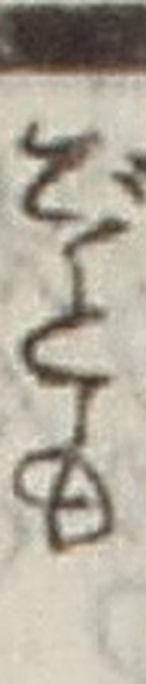ごとも
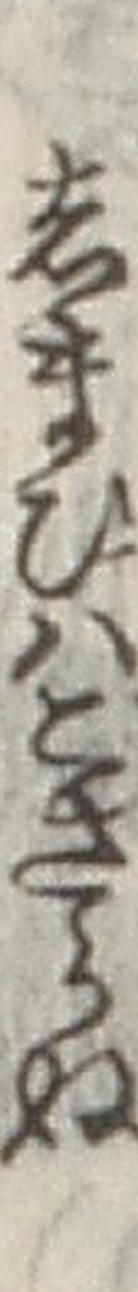しまひはござらぬ
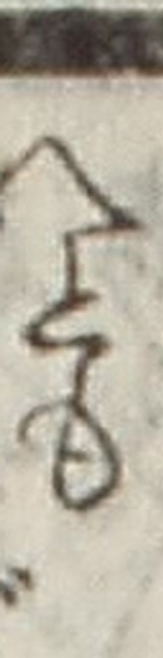ごとも
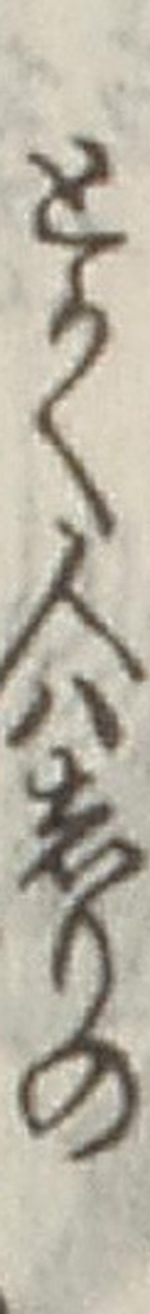とかく人はしりの
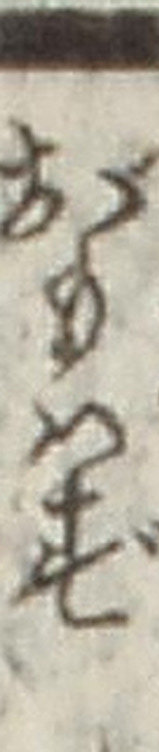おもはず
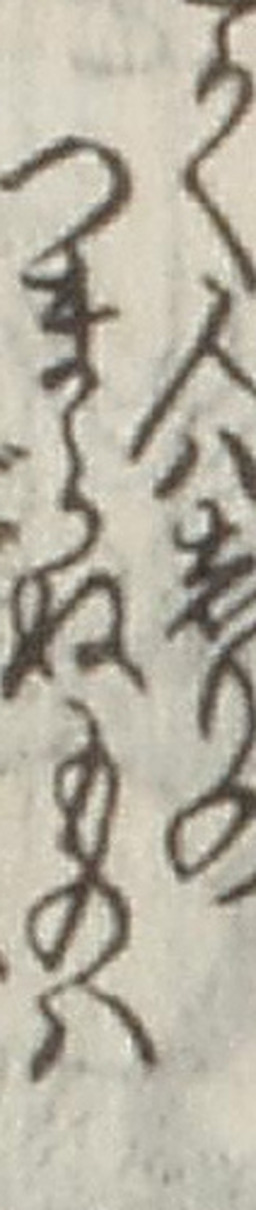つまらぬものは
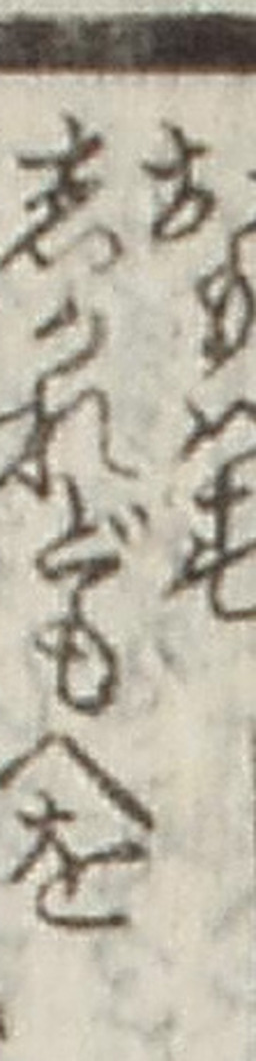しかれどもへを
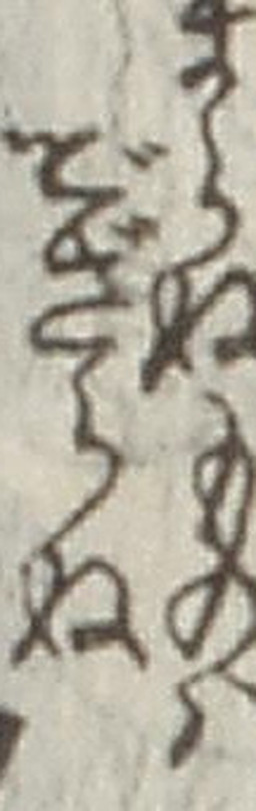ござらぬ
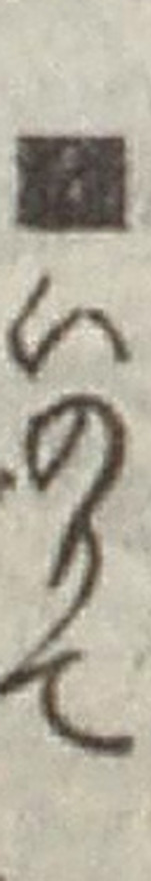いのりて
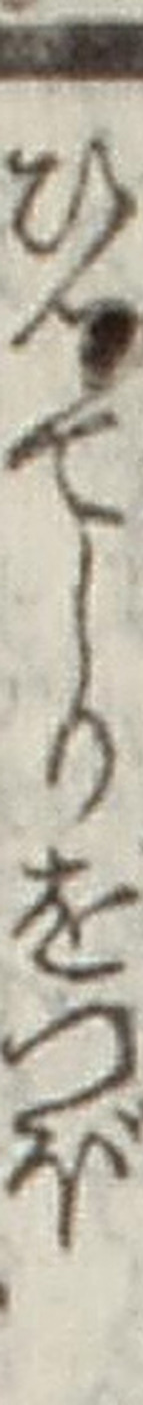ひつてしりをつぼ
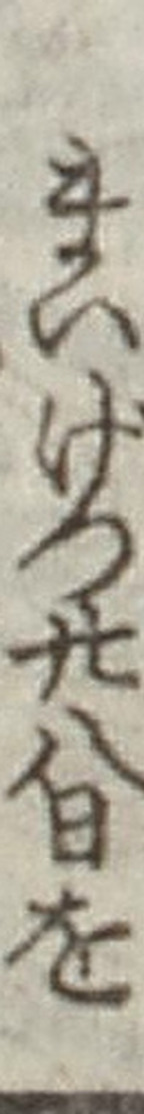まいげつ廿八日を
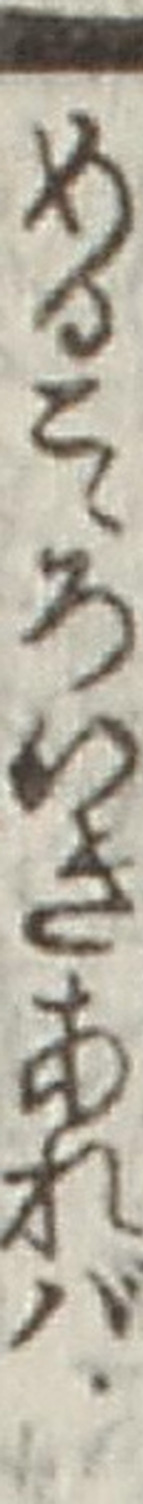めるこゝろいきあれば
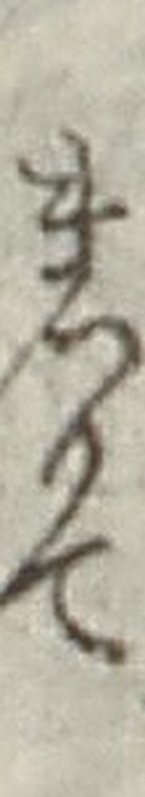まつりて
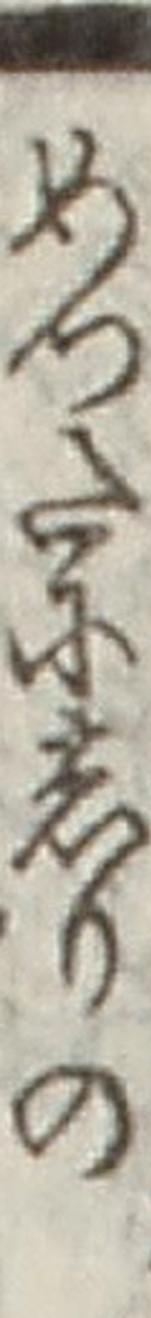めつたにしりの
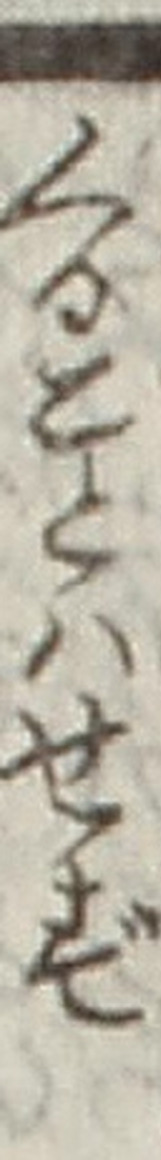くることはせず
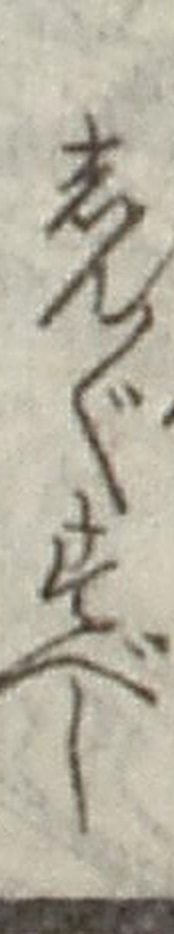しん〴〵すべし
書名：三世相出雲當座帳　上下冊
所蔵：東京大学地震研究所図書室 Earthquake Research Institute Library, The University of Tokyo, JAPAN
